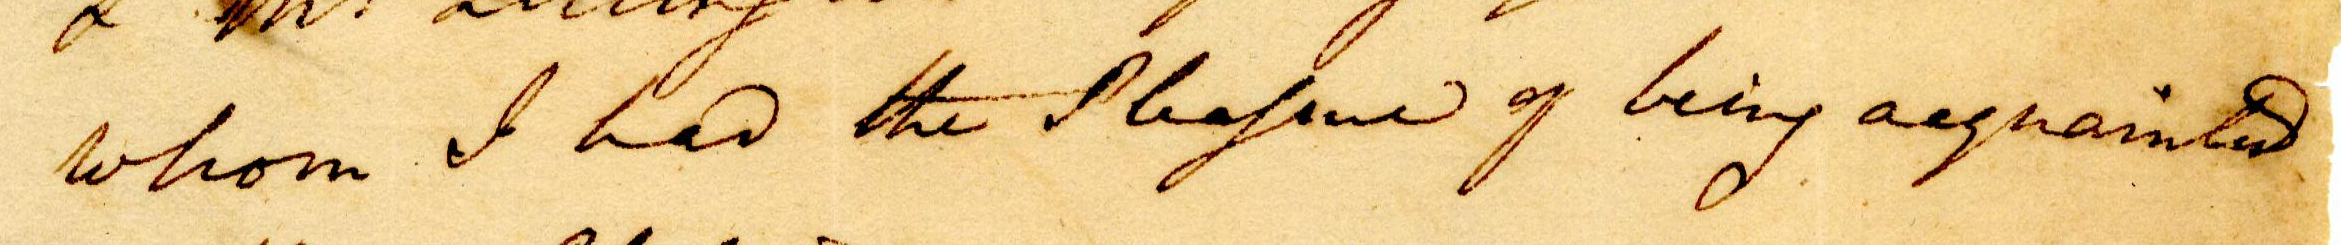whom I had the Pleasure of being acquainted
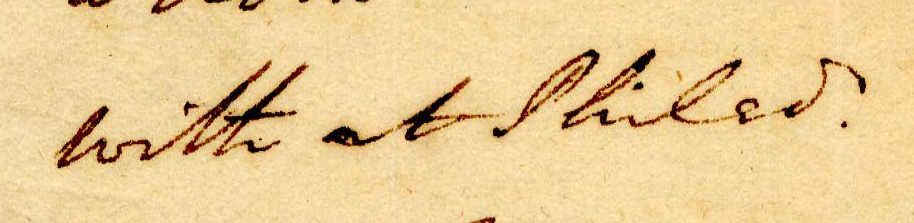with at Philad^a.
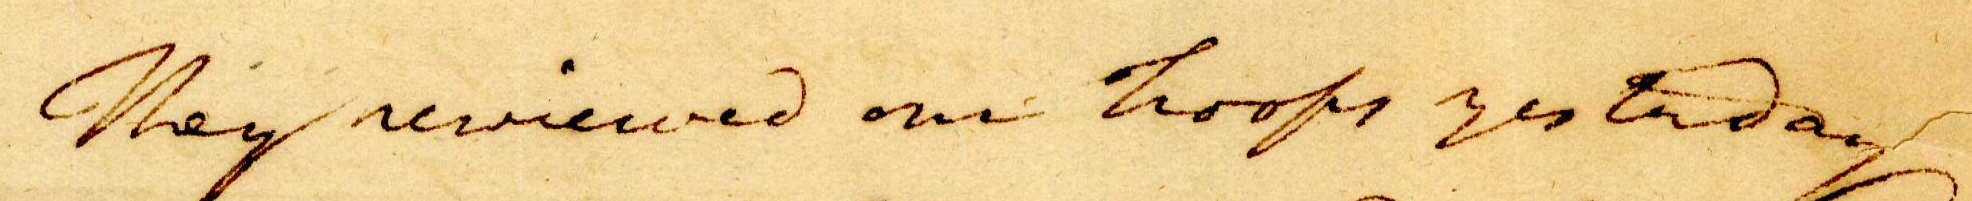They received our Troops yesterday
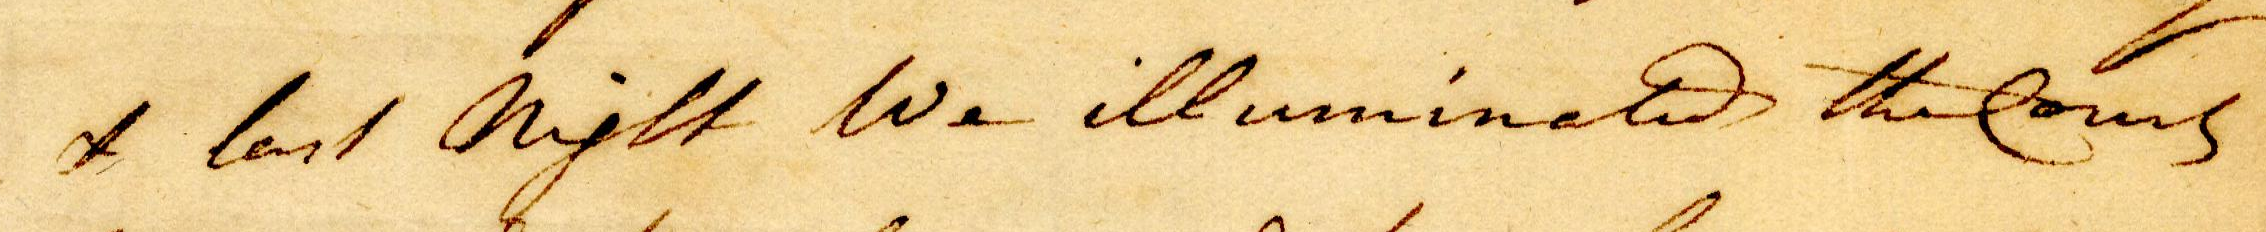& last Night We illuminated the Court
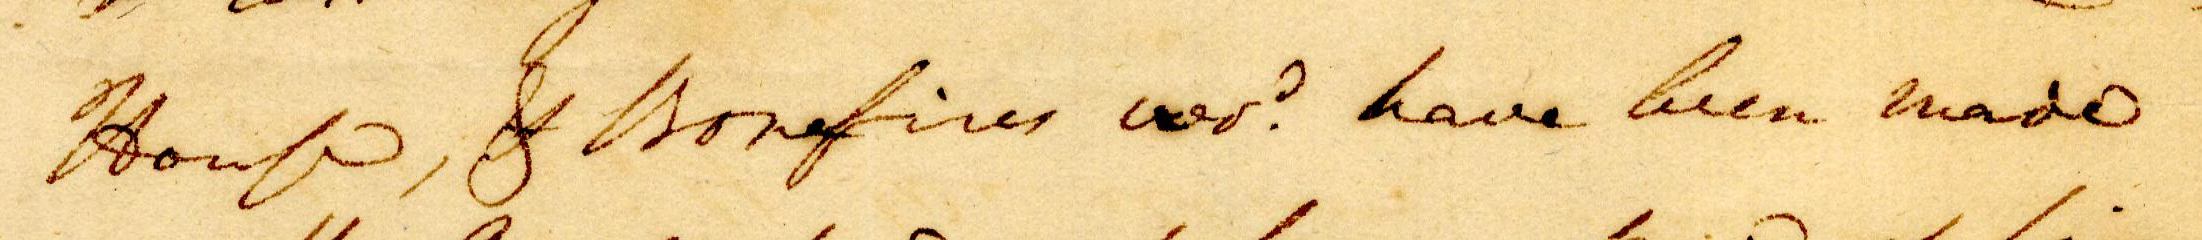House, & Bonfires wo^d. have been made
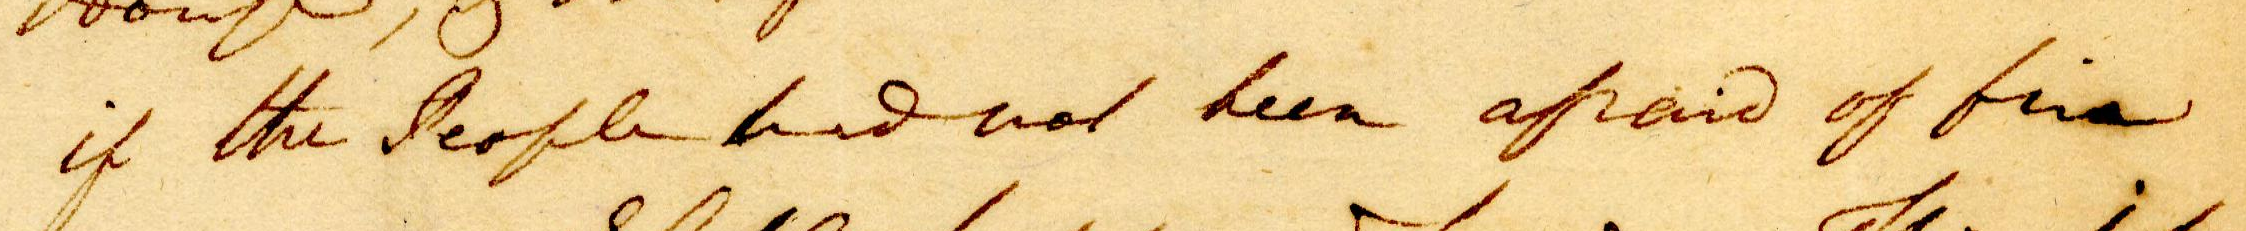if the People had not been afraid of fire
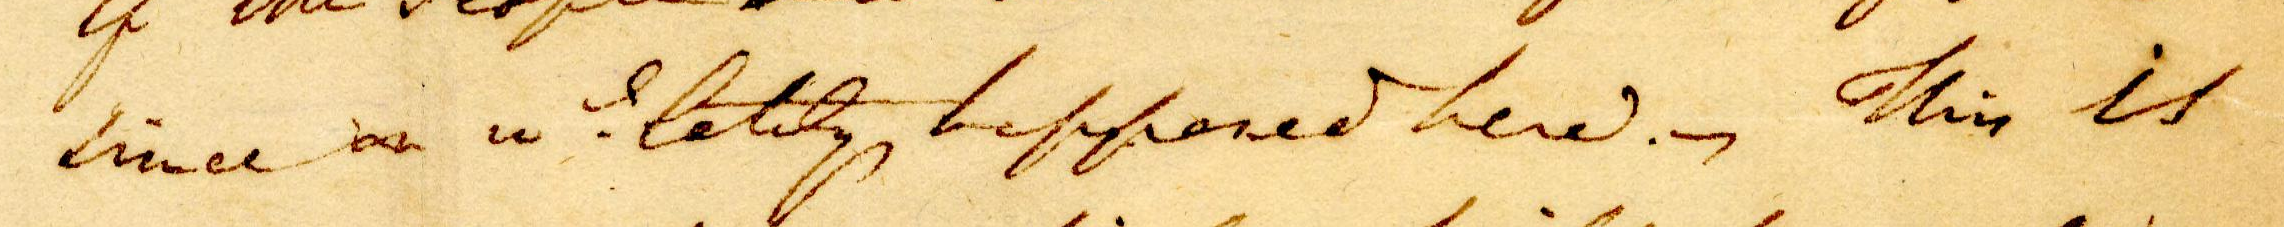since on w^ch. lately happened here. This is
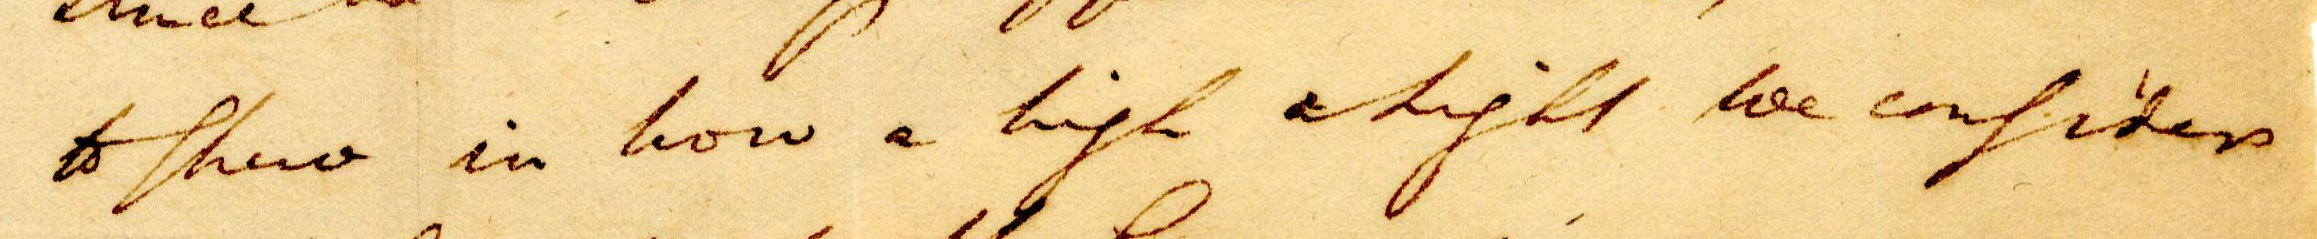to shew in how a high a height we consider
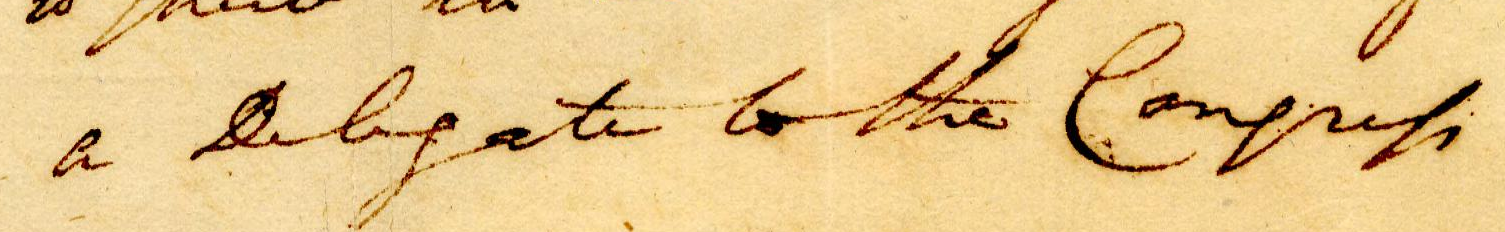a Delegate to the Congress
